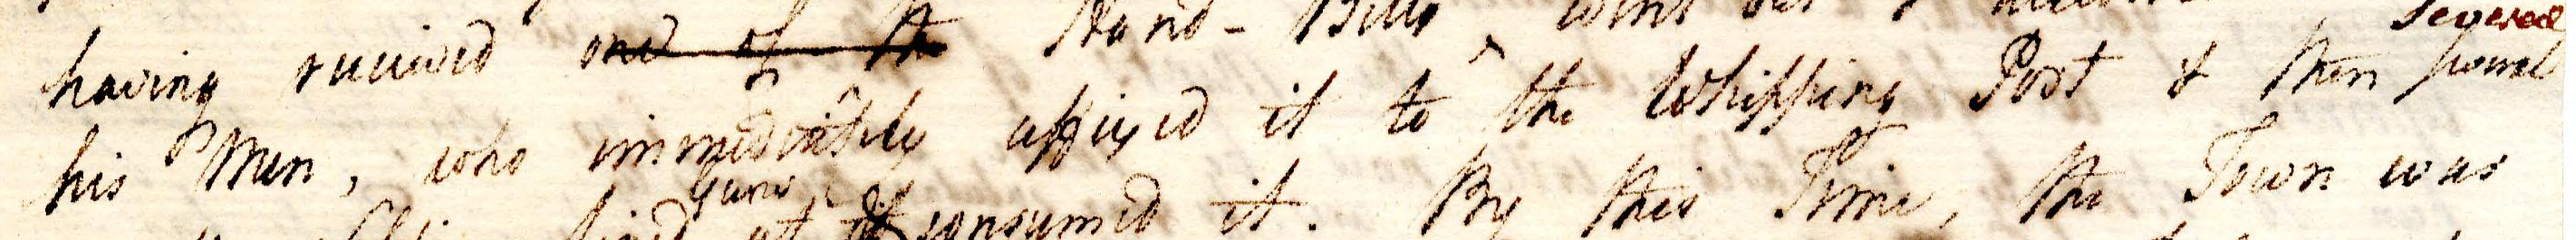his men, who immediately applied it to the Whippers Post & then several
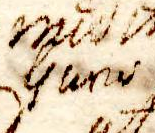Guns
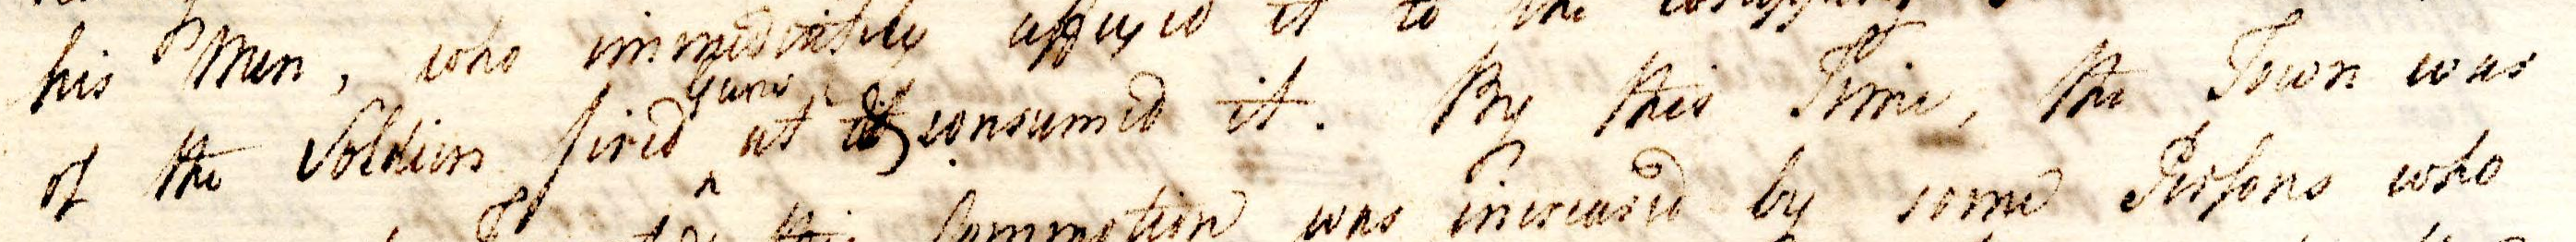of the Soldiers fired ^ at & consumed it. By this Time, the Town was
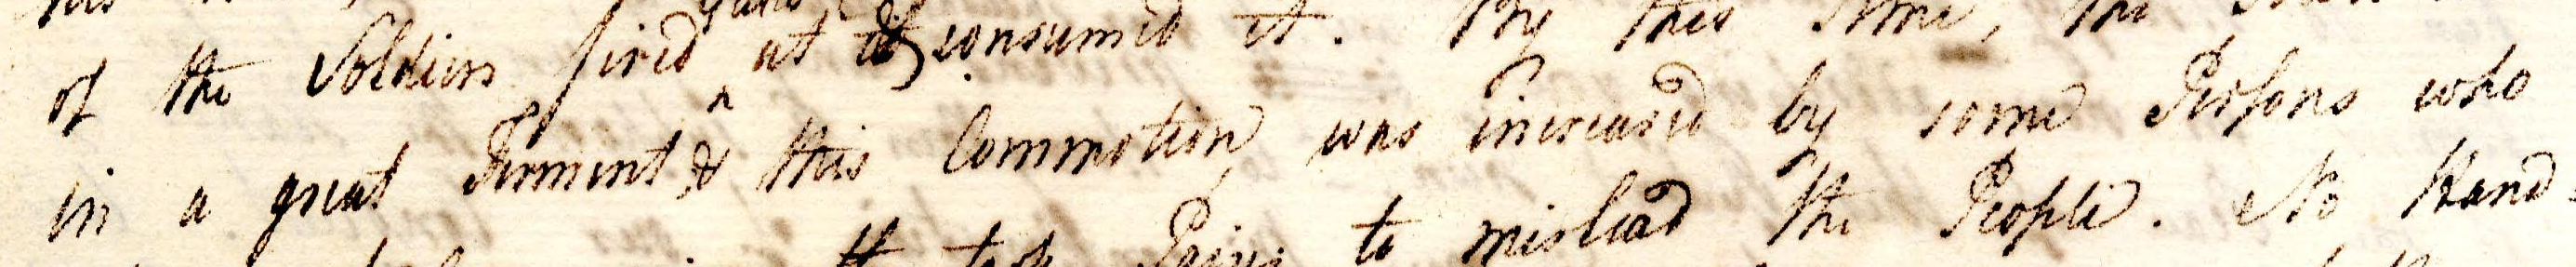in a great Ferment & this Commotion was increased by some Persons who
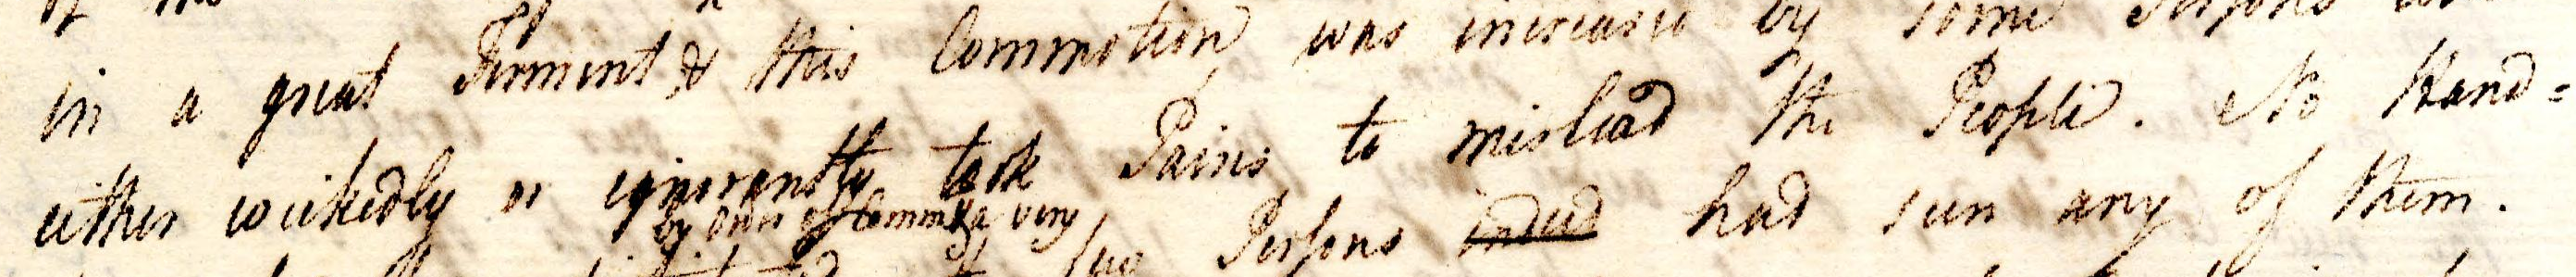either wickedly or ignorantly took Pains to mislead the People. No Hand-
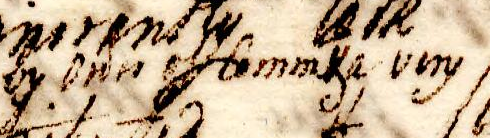By one of Comm & a very
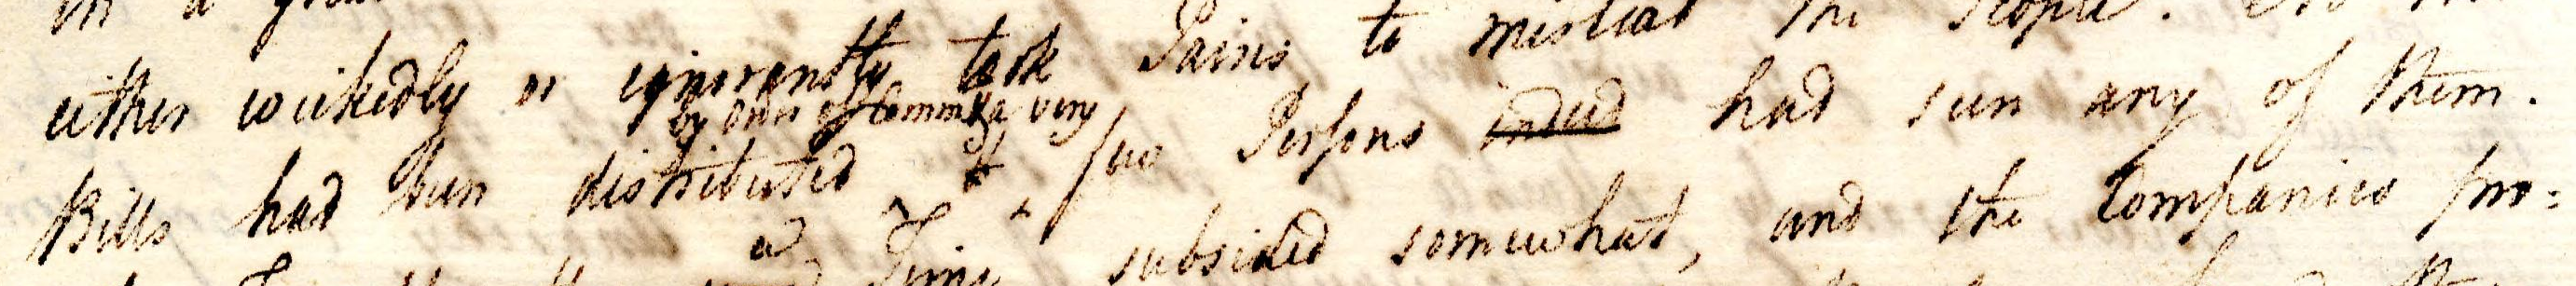Bills had been distributed ^ & ^ few Persons indeed had seen any of them.
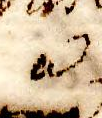a
